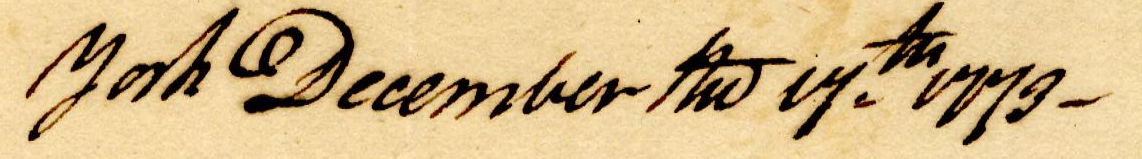York December the 17^th 1773
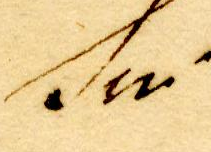Sir
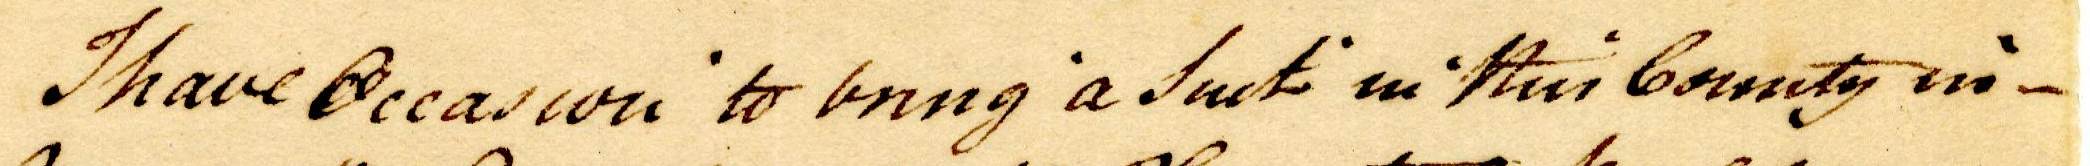I have Occasion to bring a Suit in this Country in-
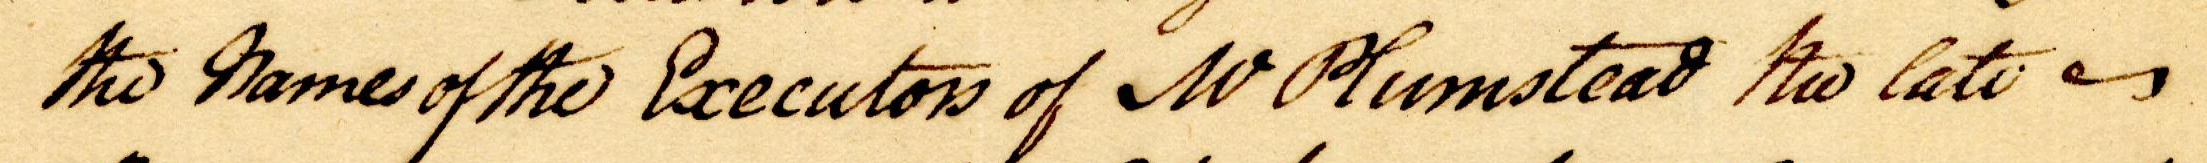the Names of the Executors of M^r Plumstead the late
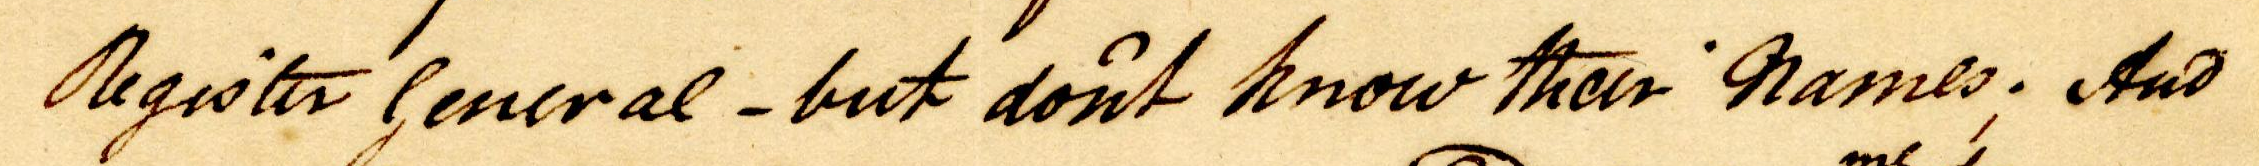Register General- but don't know their Names. And
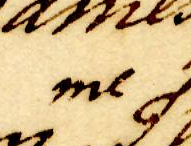me
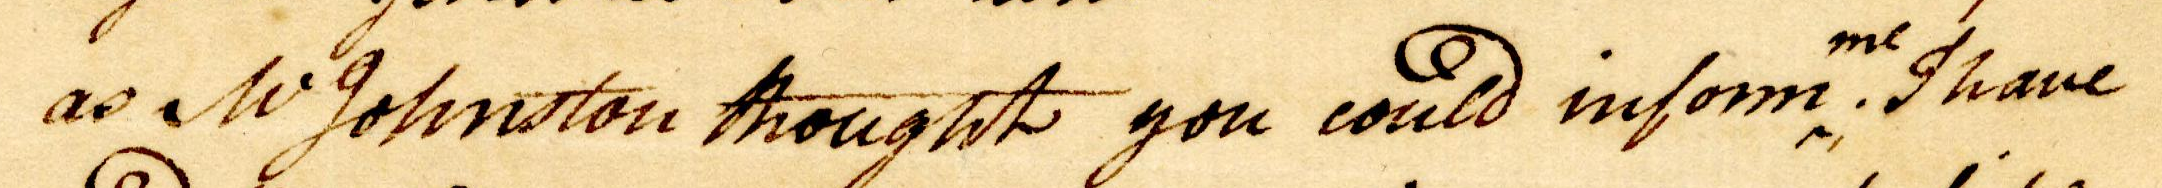as M^r Johnston thought you could inform ^ . I have
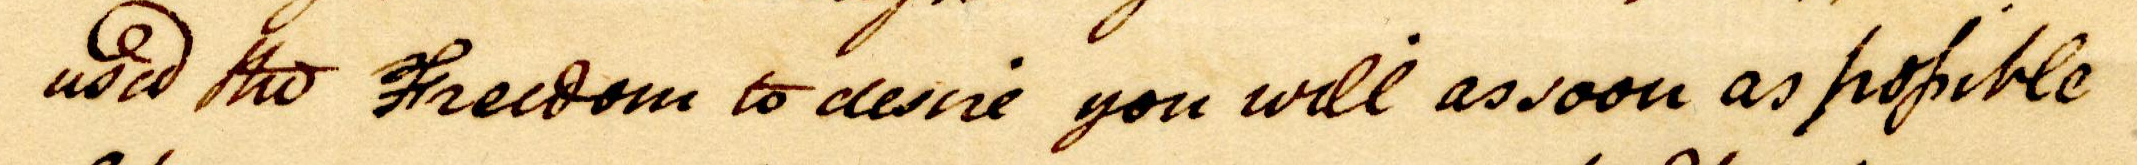used the Freedoms to desire you will as soon as possible
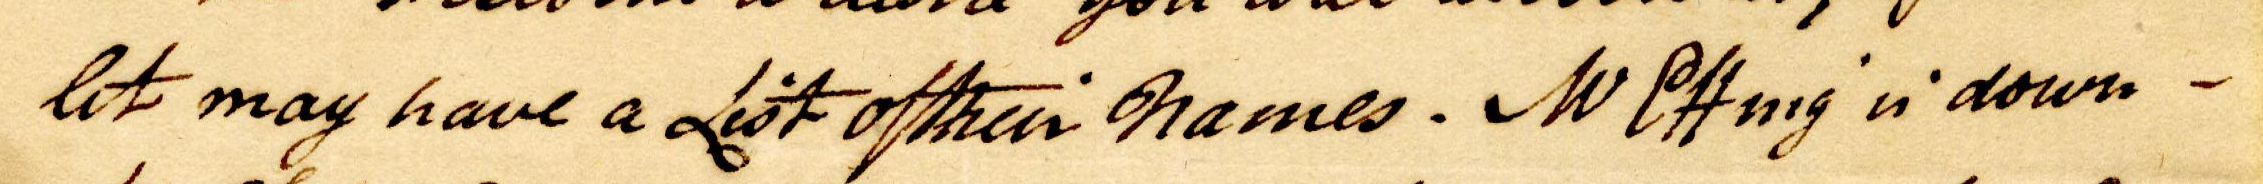lot may have a List of their Names. M^r Effing in down
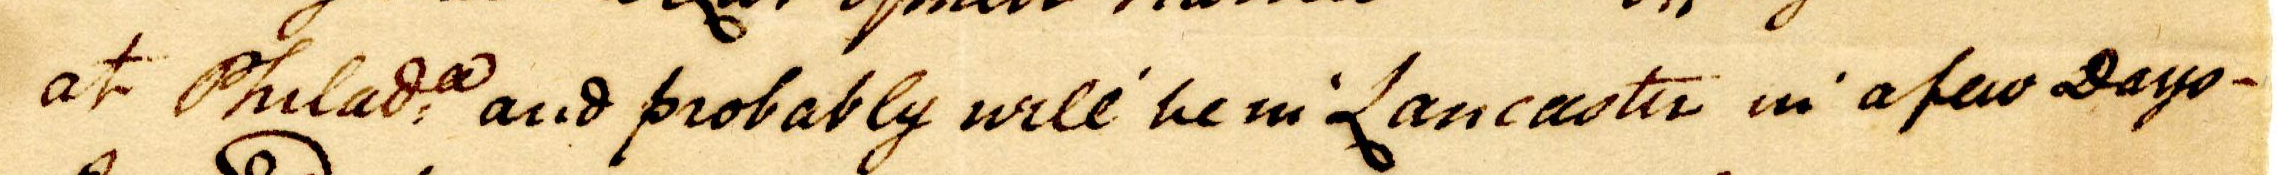at Philad^a. and probably will be in Lancaster in a few Days-
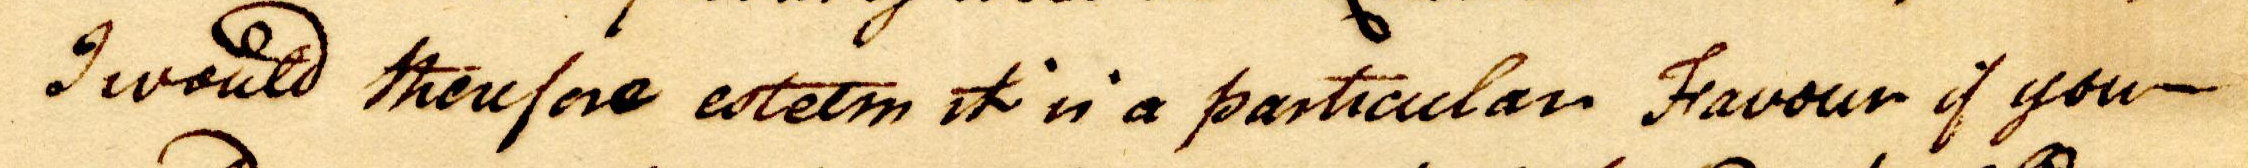I would therefore esteem it is a particular Favour if you
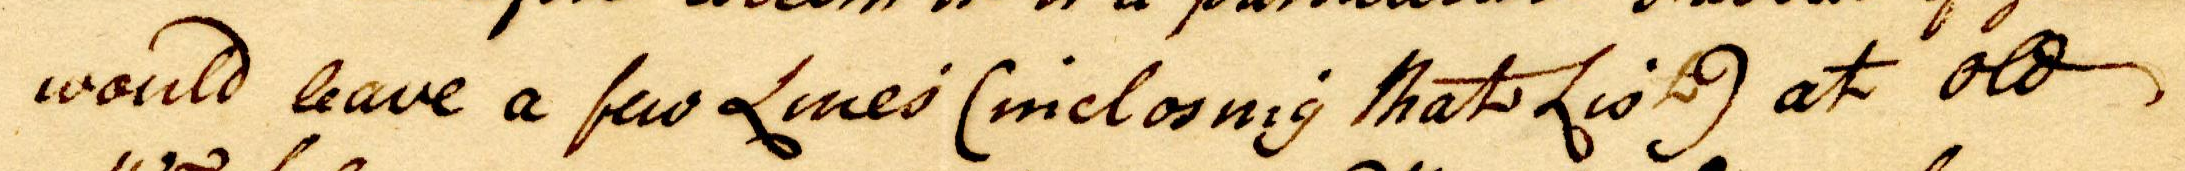would leave a few Lines (inclosing that List) at old
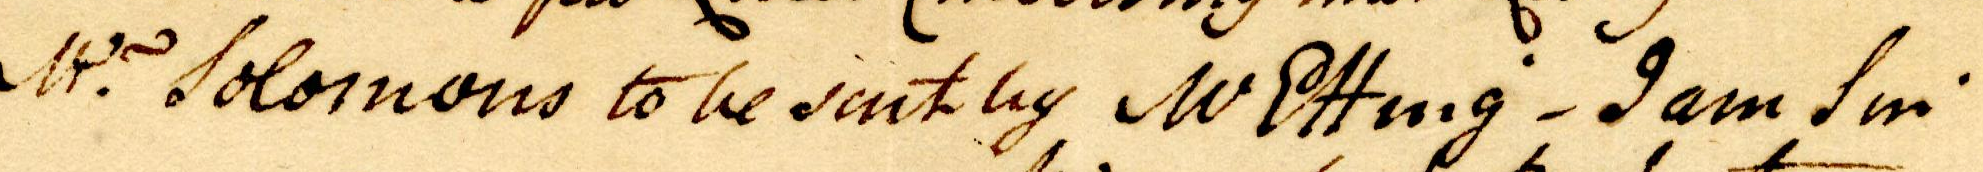M^r. Solomons to be sent by M^r Etting. I am Sir
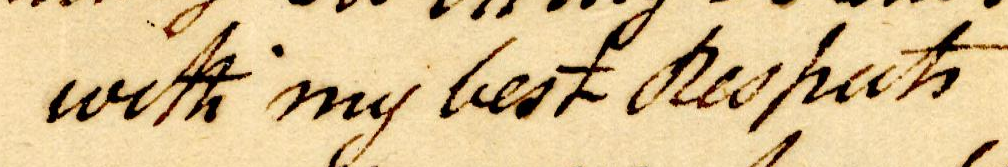with my best Respects
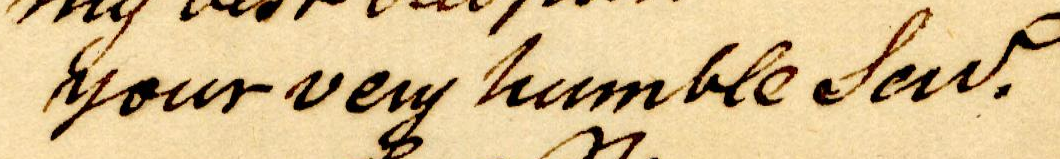Your very humble Serv^t.
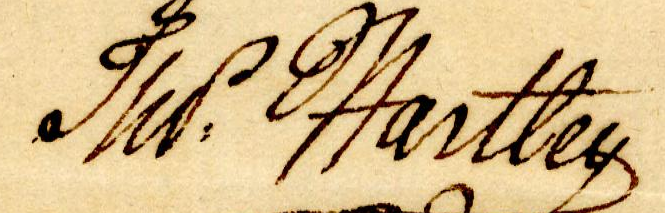Tho^s. Hartley
